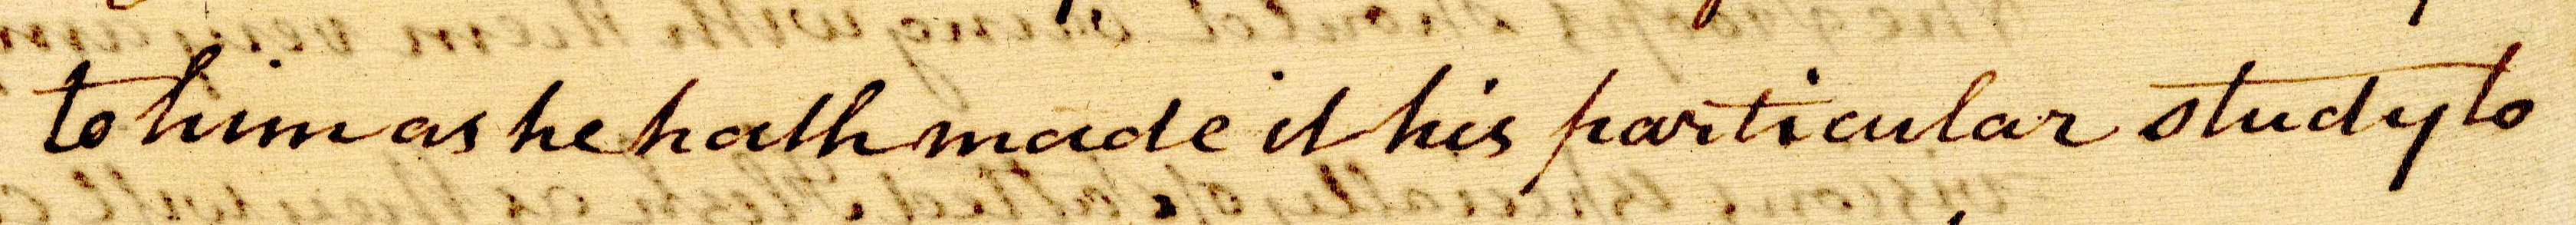to him as he hath made it his particular study to
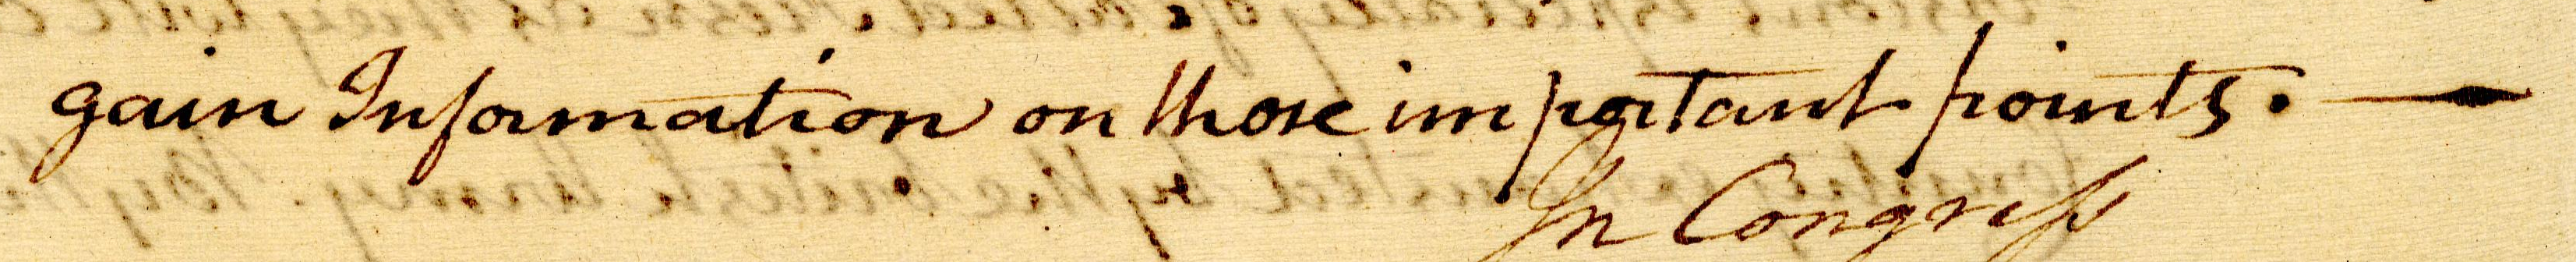gain Information on those important points.-
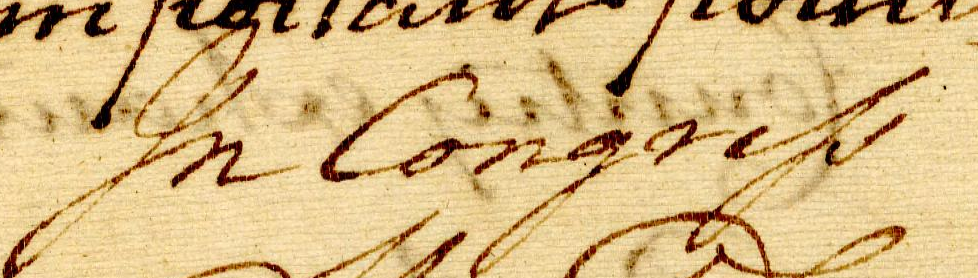In Congress
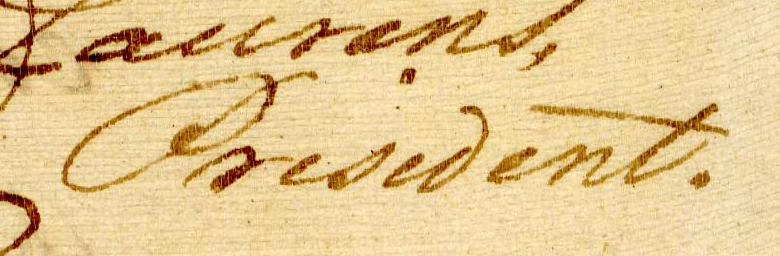President.
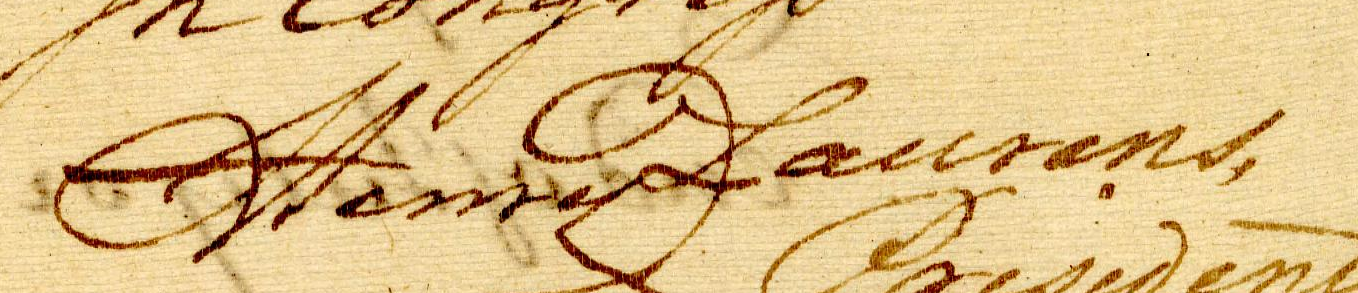Henry Laurens,
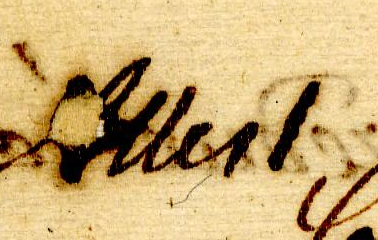Allert
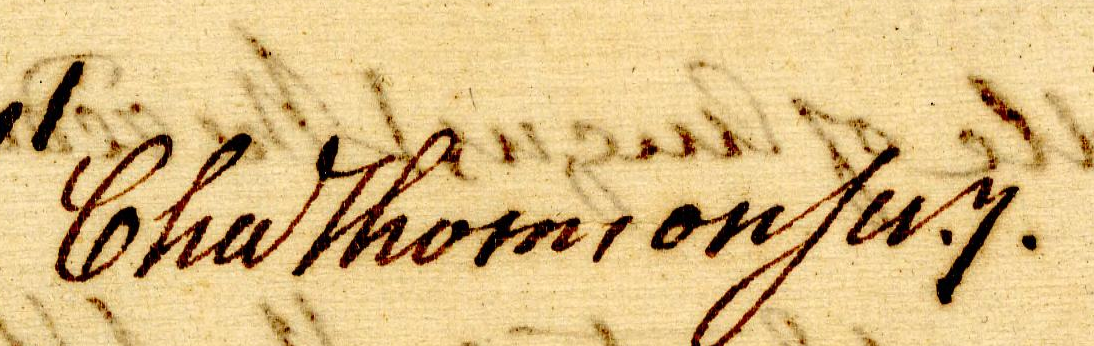Cha^l Thomson Ju^y.
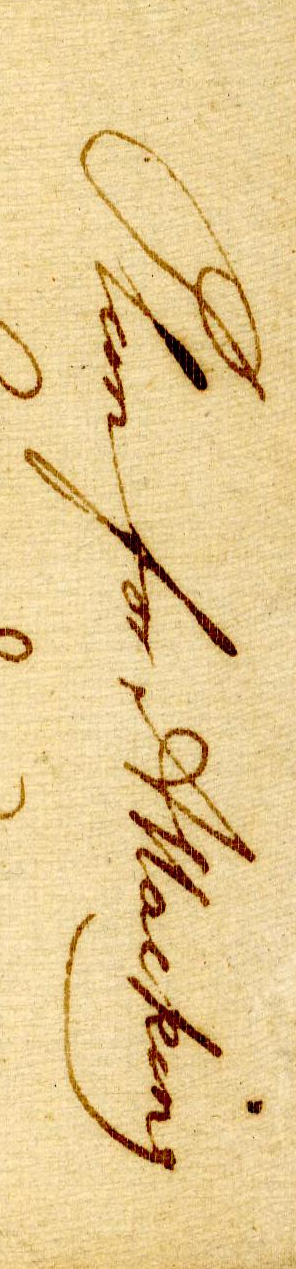Plan for Attacking
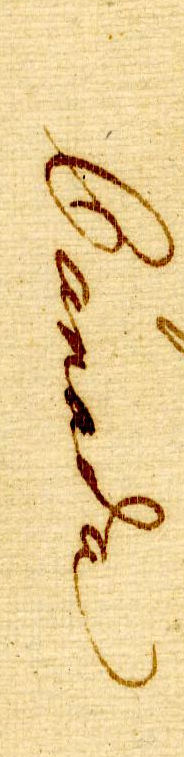Canada
